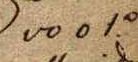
vo o 1.o
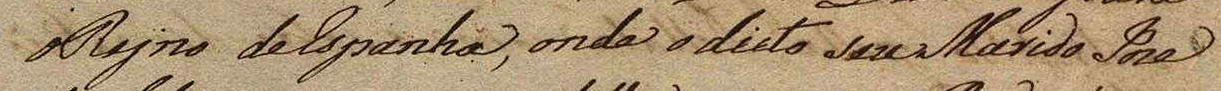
o Rejno de Espanha, onde o dicto seu Marido Ioze
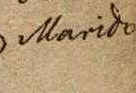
Marido
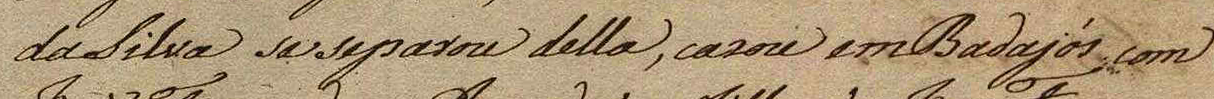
da Silva se separou della, cazou em Badajós, com
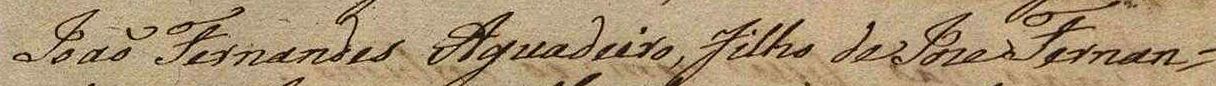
Ioaõ Fernandes Aguadeiro, filho de Ioze Fernan
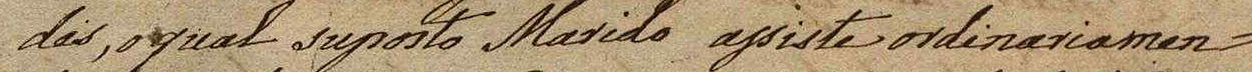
des, o qual suposto Marido assiste ordinariamen
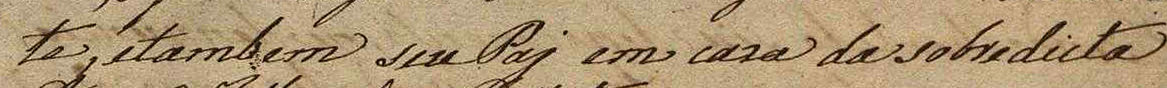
te, e tambem seu Paj em caza da sobredicta
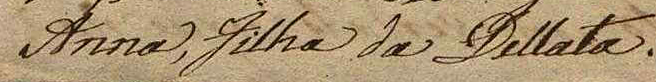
Anna, filha da Dellata.
